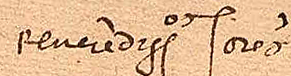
Reuerēdissos Sores̄
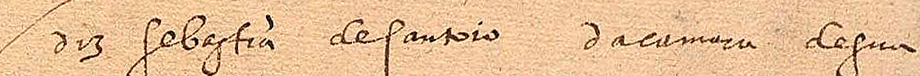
diz sebastiā de santoio da camara de sua
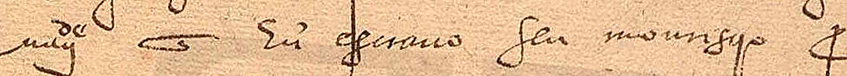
Magde q̄ hū escrauo seu mourisqo ꝑ
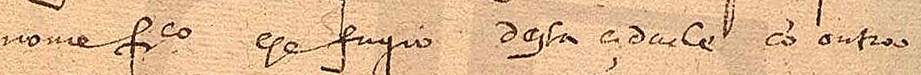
nome frco lhe fugio desta cidade cō outroo
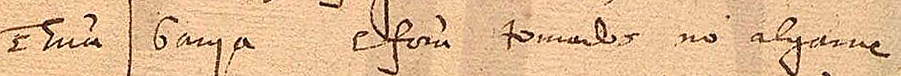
Ē huā barqa E forā tomados no algarue
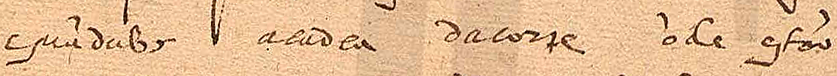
e Mādados a cadea da corte ōde estaõ
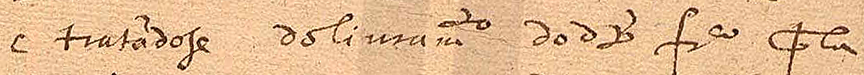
E tratādose do liuramto do dtō frco p̄la
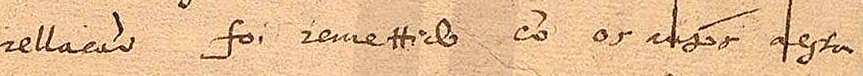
rellação foi remettido cō os outōs a esta
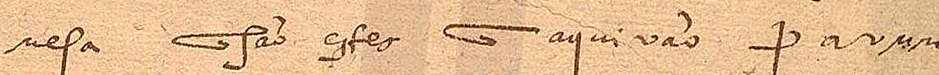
Mesa q̄ saõ estes q̄ aqui vaõ P a vMM
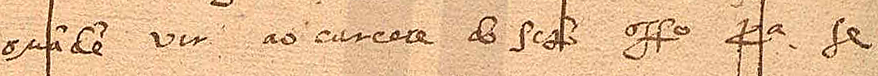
o Mādē vir ao carcere do sctō offo ꝑa se
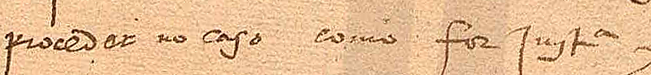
proceder no caso como for Justa
